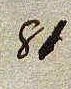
81
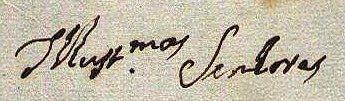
Illust.mos Senhores
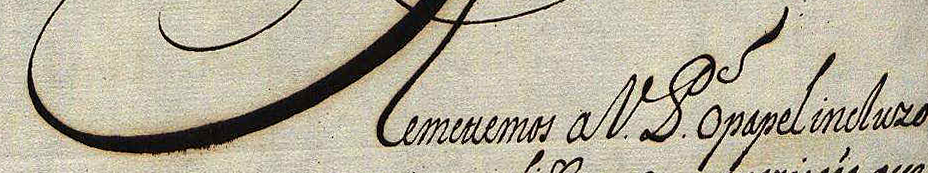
Remetemos a V. P.e o papel incluzo
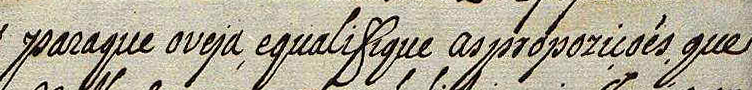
para que o veja, e qualifique as propoziçoẽs, que
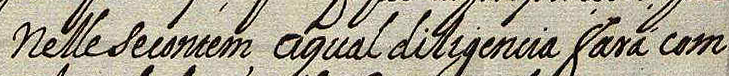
nelle se contem, a qual diligencia fará com
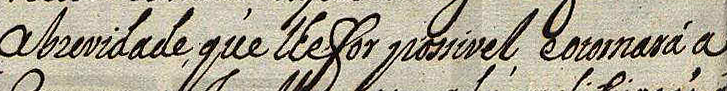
a brevidade, que lhe for possivel, e o tornará a
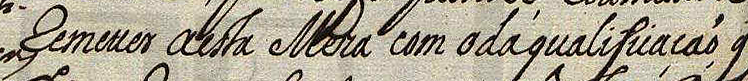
Remetter a esta Meza com o da qualificaçaõ q̄
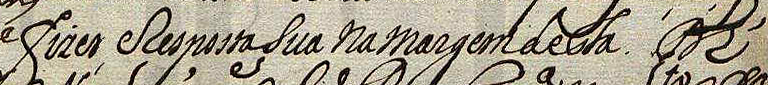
fizer, e Resposta Sua na margem desta. Ds̄
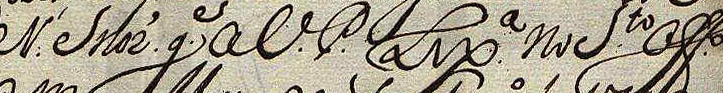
N. Snor̄. g.e a V. P. Lix.a no S.to Off.o
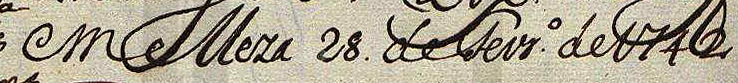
em Meza 28. de Fevr.o de 1742
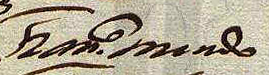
Fran.co mendo
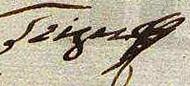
Trigoso
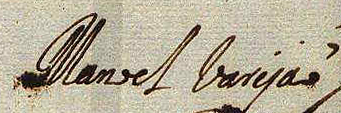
Manoel Varejaõ
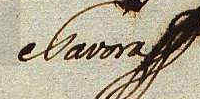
e Tavora
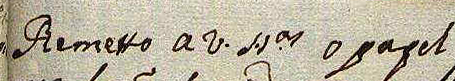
Remetto a v. s.sa.s o papel
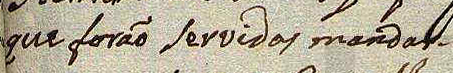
que foraõ servidos mandar
